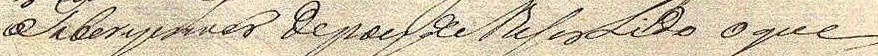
o saber escrever depois de lhe ser Lido o que
